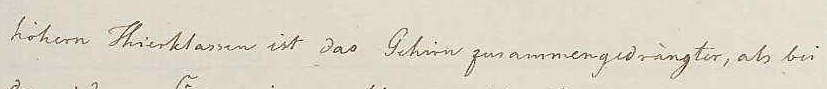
höhern Thierklassen ist das Gehirn zusammengedrängter, als bei
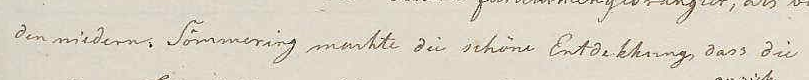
den niedern. Sömmering machte die schöne Entdekkung, dass die
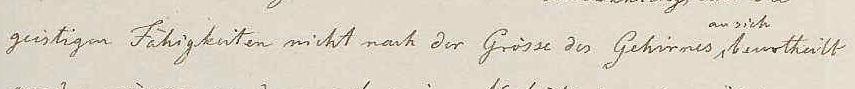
geistigen Fähigkeiten nicht nach der Grösse des Gehirnes an sich beurtheilt
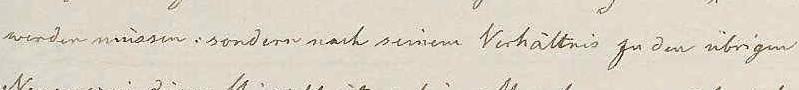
werden müssen: sondern nach seinem Verhältnis zu den übrigen
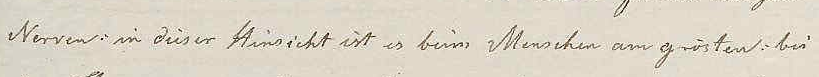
Nerven: in dieser Hinsicht ist es beim Menschen am grösten: bei
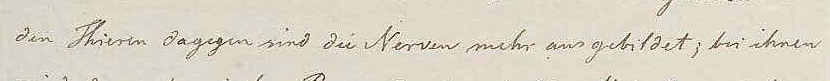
den Thieren dagegen sind die Nerven mehr ausgebildet; bei ihnen
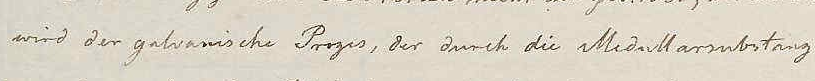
wird der galvanische Prozes, der durch die Medullarsubstanz
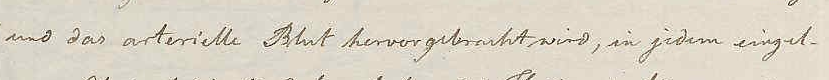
und das arterielle Blut hervorgebracht wird, in jedem einzel-
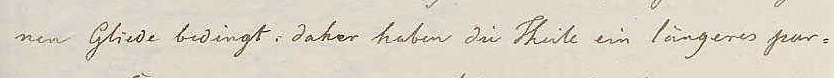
nen Gliede bedingt: daher haben die Theile ein längeres par-
